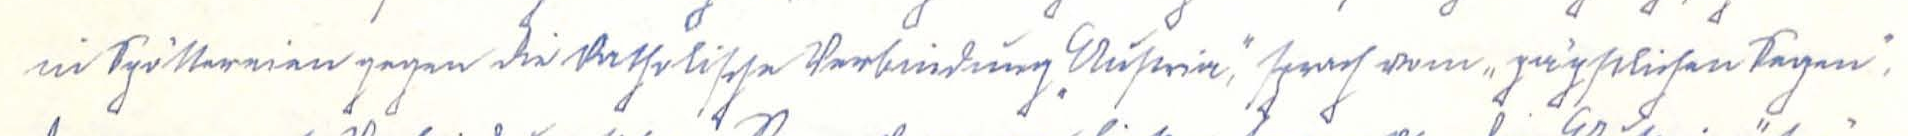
in Spöttereien gegen die katholische Verbindung "Austria“, sprach vom "päpstlichen Segen“
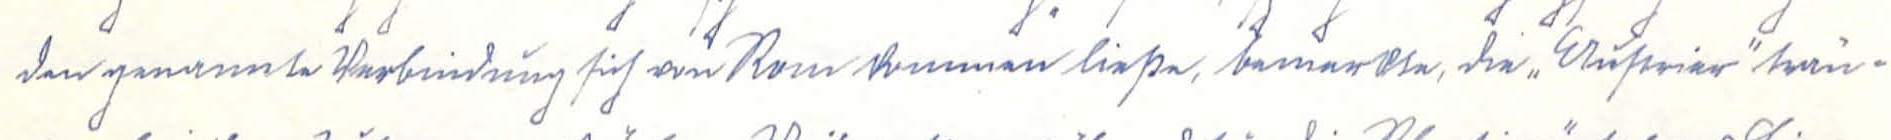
den genannte Verbindung sich von Rom kommen ließe, bemerkte, die „Austrier" trän-
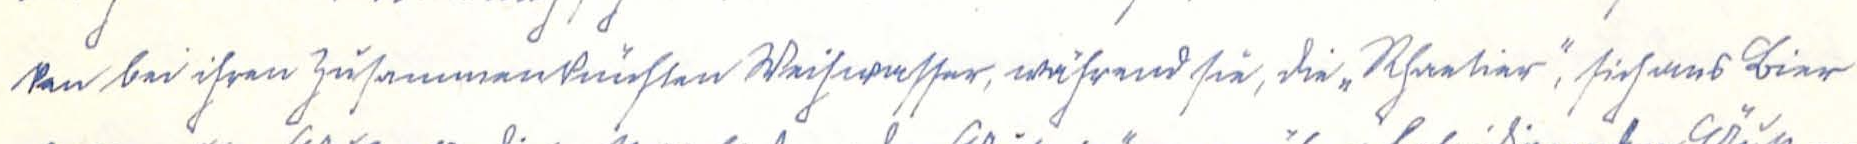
ken bei ihren Zusammenkünften Weihwasser, während sie, die „Rhaetier“, sich ans Bier
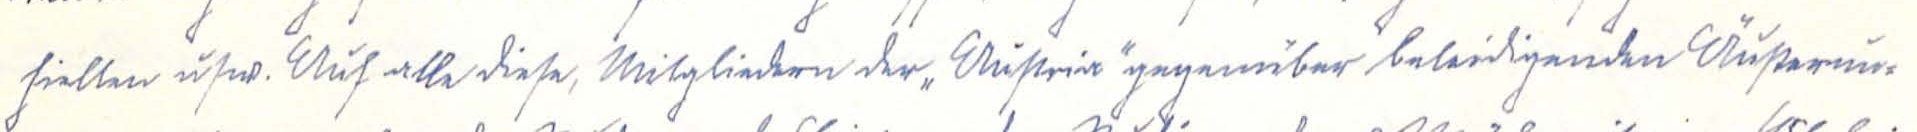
hielten usw. Auf alle diese, Mitgliedern der „Austria“ gegenüber beleidigenden Äußerun
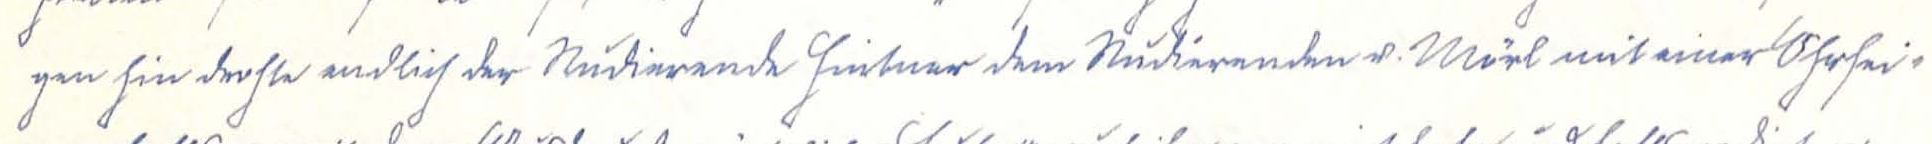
gen hin drohte endlich der Studierende Hintner dem Studierenden v. Mörl mit einer Ohrfei-
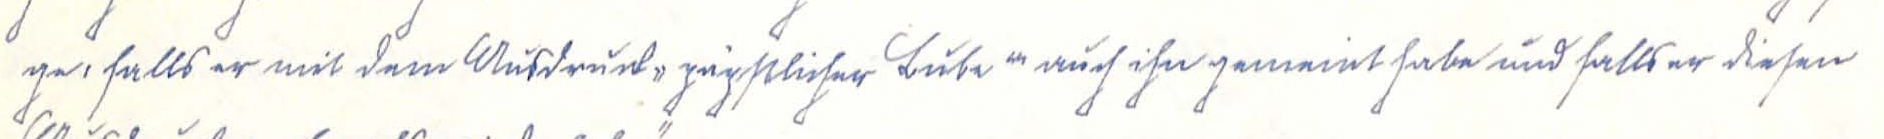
ge, falls er mit dem Ausdruck "päpstlicher Bube" auch ihn gemeint habe und falls er diesen
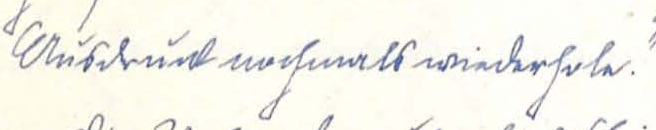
Ausdruck nochmals wiederhole.
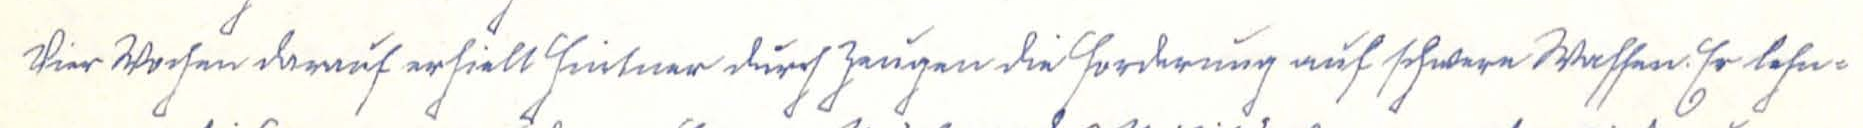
Vier Wochen darauf erhielt Hintner durch Zeugen die Forderung auf schwere Waffen Er lehn-
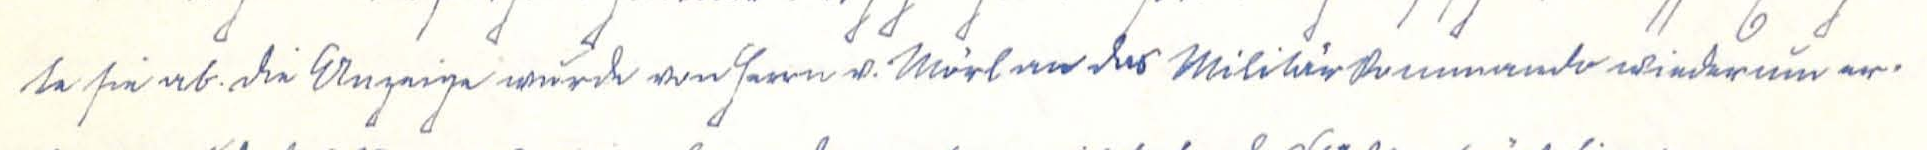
te sie ab. Die Anzeige wurde von Herrn v. Mörl an das Militärkommando wiederum er-
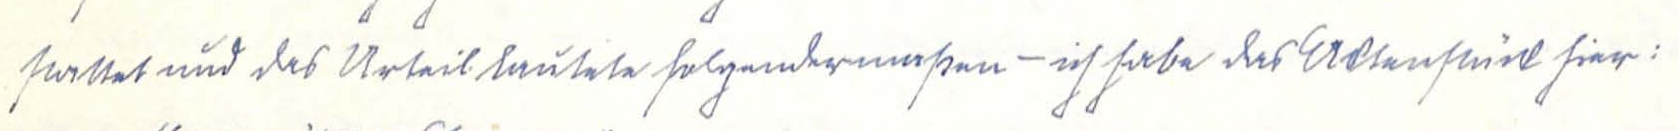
stattet und das Urteil lautete folgendermaßen- ich habe das Aktenstück hier:
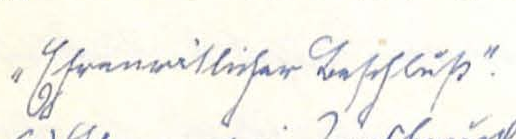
"Ehenrätlicher Beschluß".
